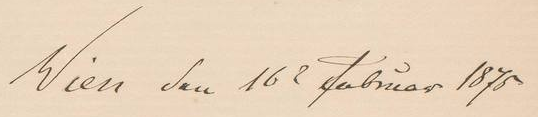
Wien den 16t Februar 1875
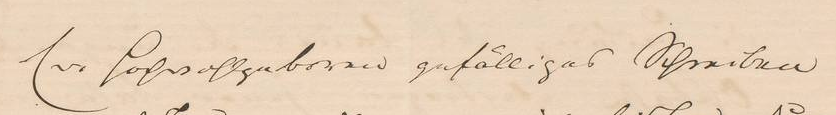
Ew Hochwohlgeboren gefälliges Schreiben
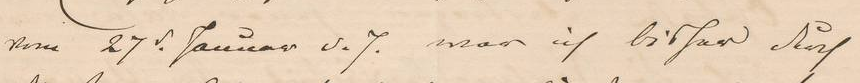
vom 27t Januar d. J. war ich bisher durch
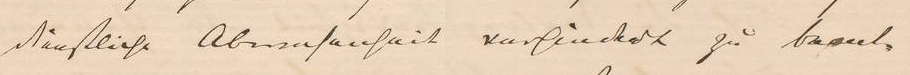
dienstliche Abwesenheit verhindert zu beant-
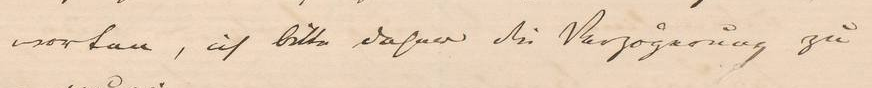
worten, ich bitte daher die Verzögerung zu
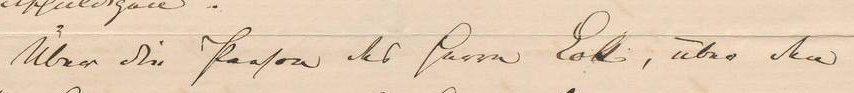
Über die Person des Herrn Lott, über die
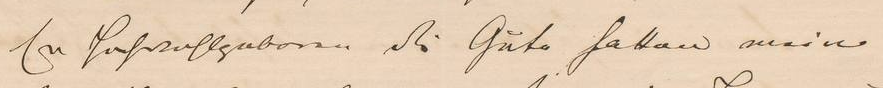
Ew Hochwohlgeboren die Güte hatten mein
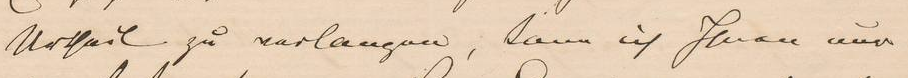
Urtheil zu verlangen, kann ich Ihnen nur
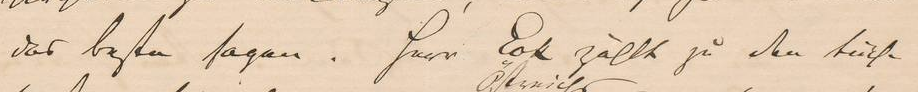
das Beste sagen. Herr Lott zählt zu den tüch-
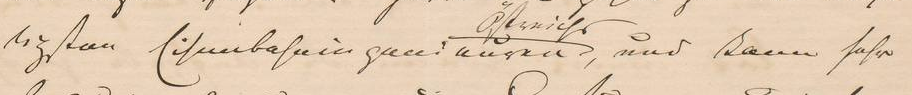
tigsten Eisenbahningenieuren Östreichs, und kann sehr
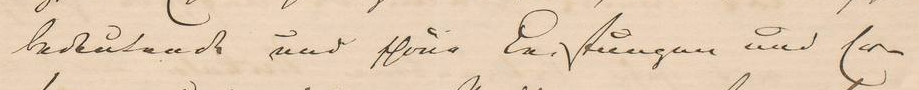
bedeutende und schöne Leistungen und Er-
